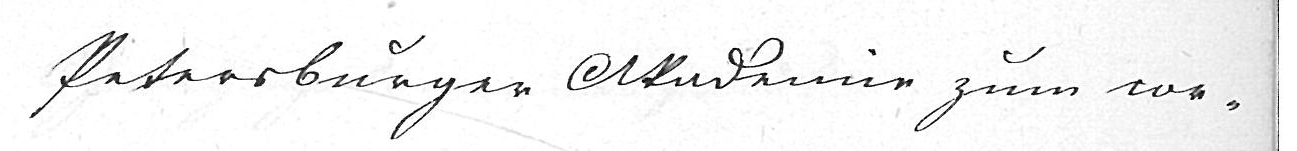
Petersburger Akademie zum cor-
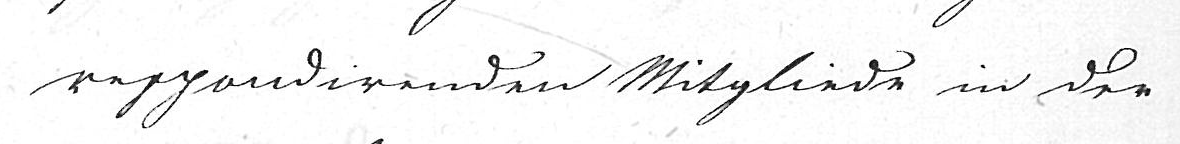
respondirenden Mitgliede in der
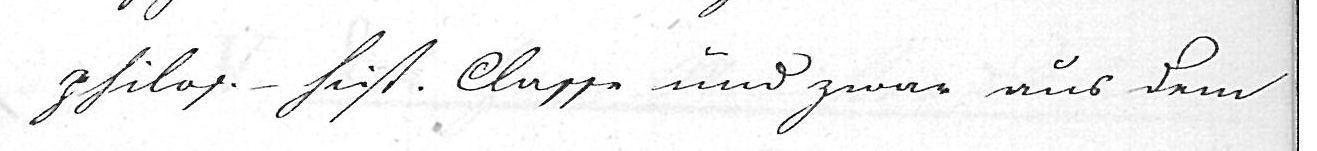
philos.-hist. Classe und zwar aus dem
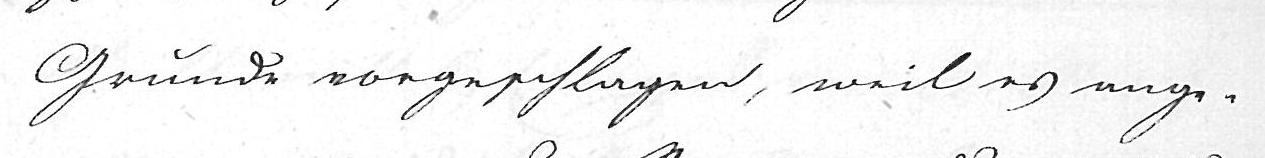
Grunde vorgeschlagen, weil es ange-
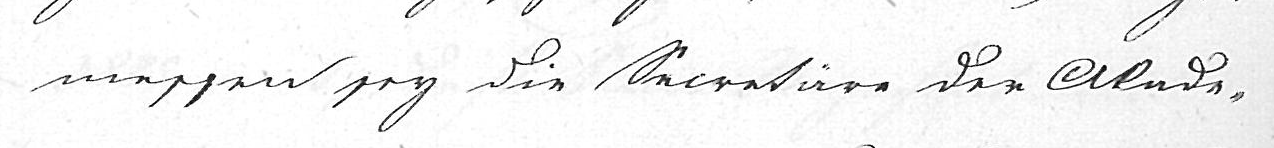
messen sey die Secretäre der Akade-
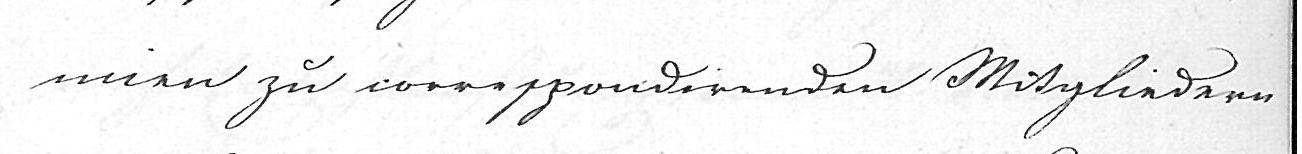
mien zu correspondirenden Mitgliedern
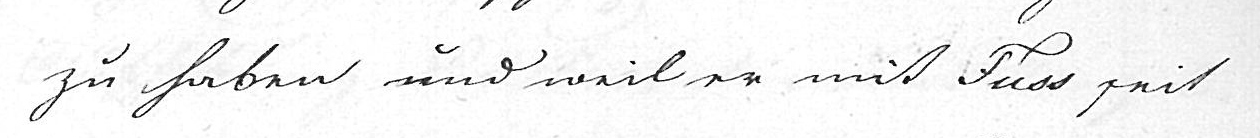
zu haben und weil er mit Fuss seit
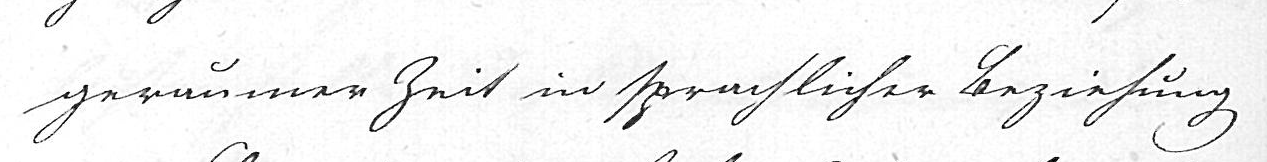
geraumer Zeit in sprachlicher Beziehung
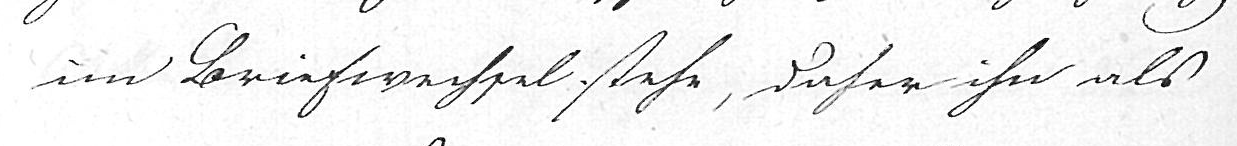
im Briefwechsel stehe, daher ihn als
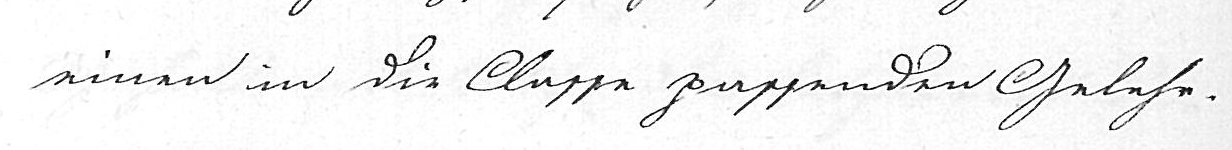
einen in die Classe passenden Gelehr-
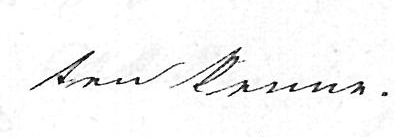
ten kenne.
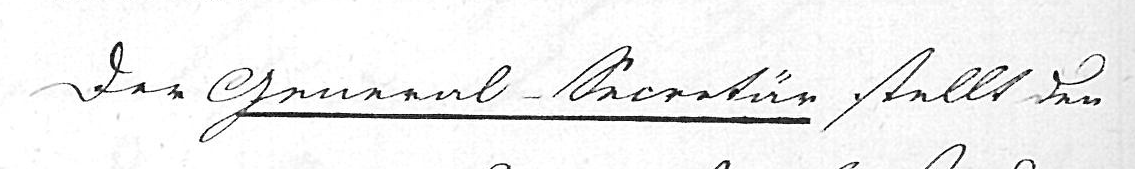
Der General-Secretär stellt den
